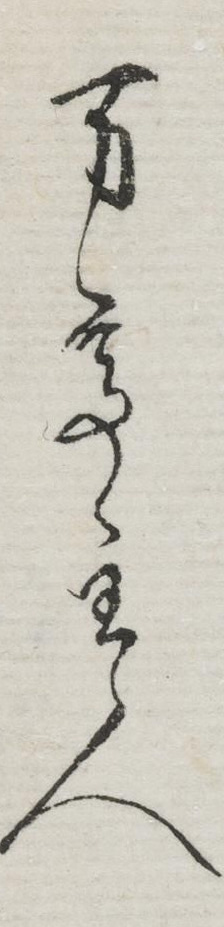万亭主人
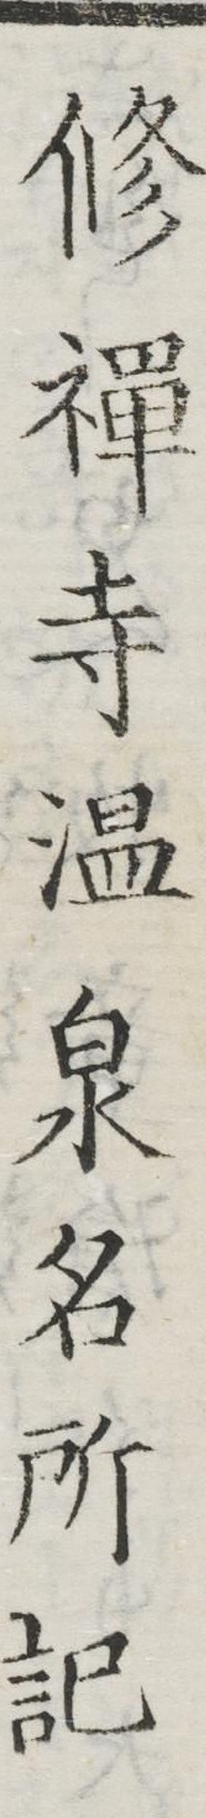修善寺温泉名所記
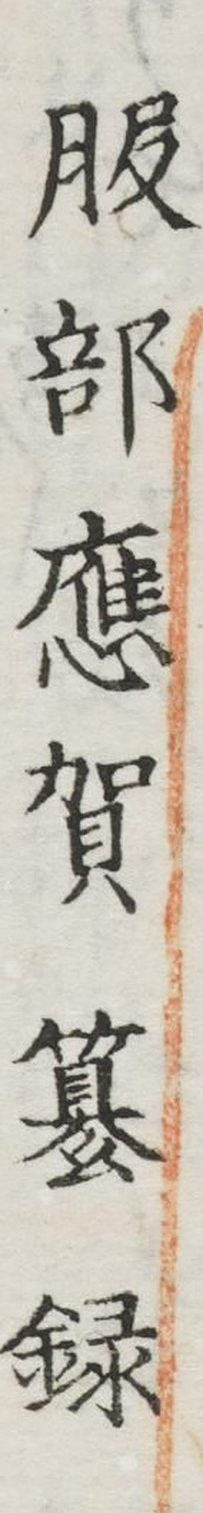服部應賀纂録
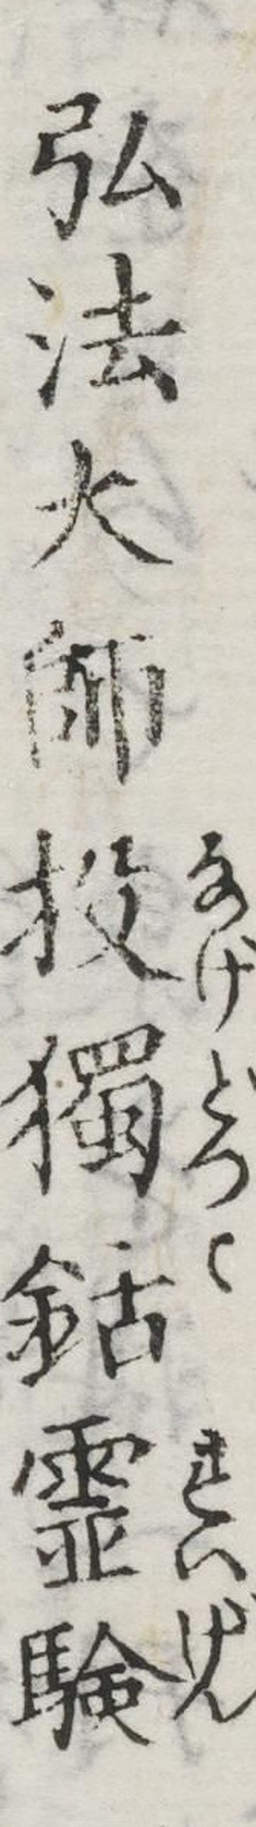弘法大師投獨鈷霊験
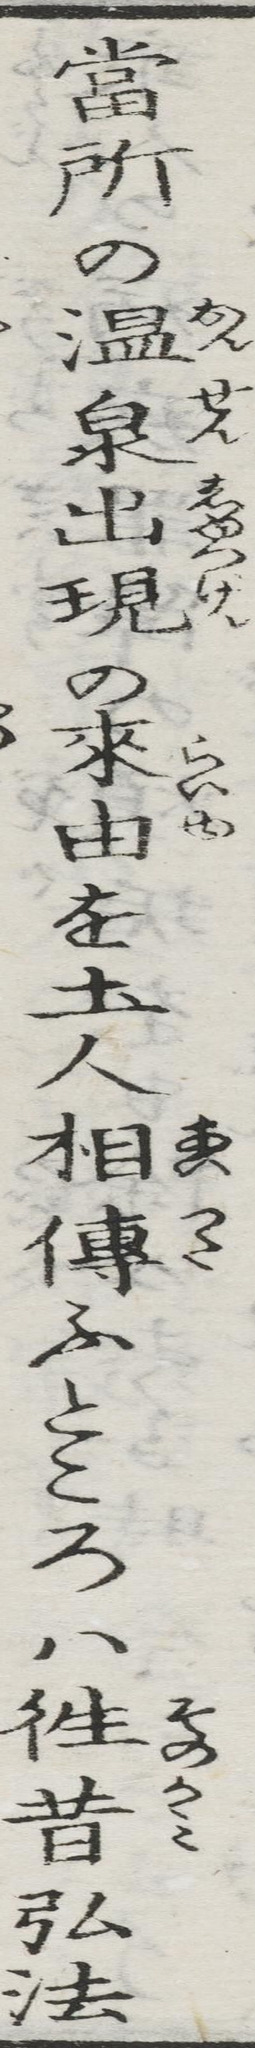當所の温泉出現の来由を土人相傳ふところは往昔弘法
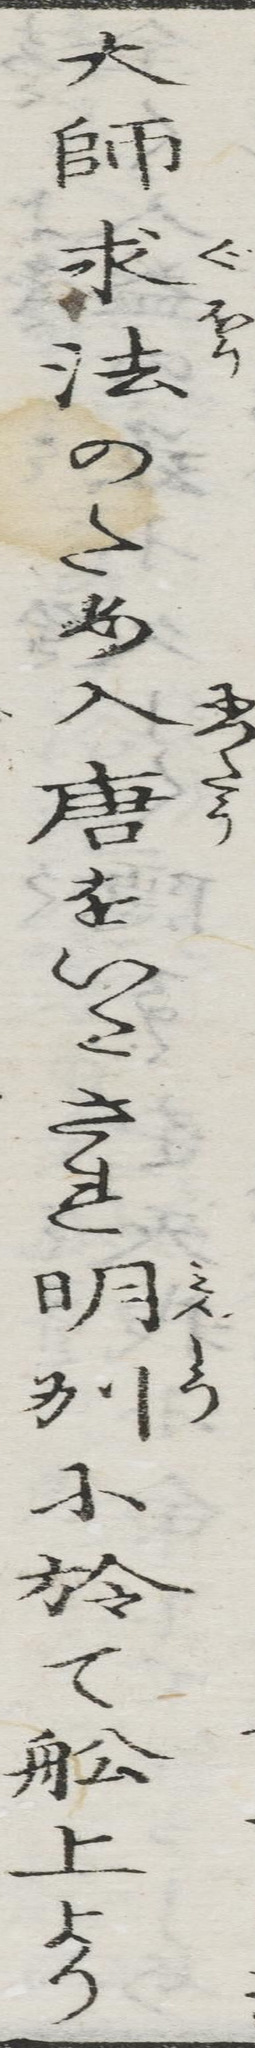大師求法のため入唐をいたされ明州に於て船上より
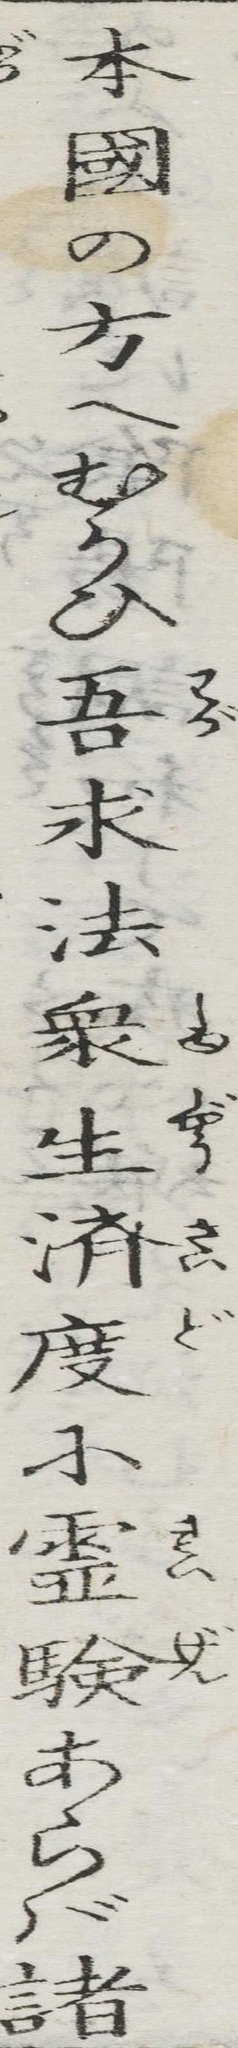本國の方へむかひ吾求法衆生済度に霊験あらば諸
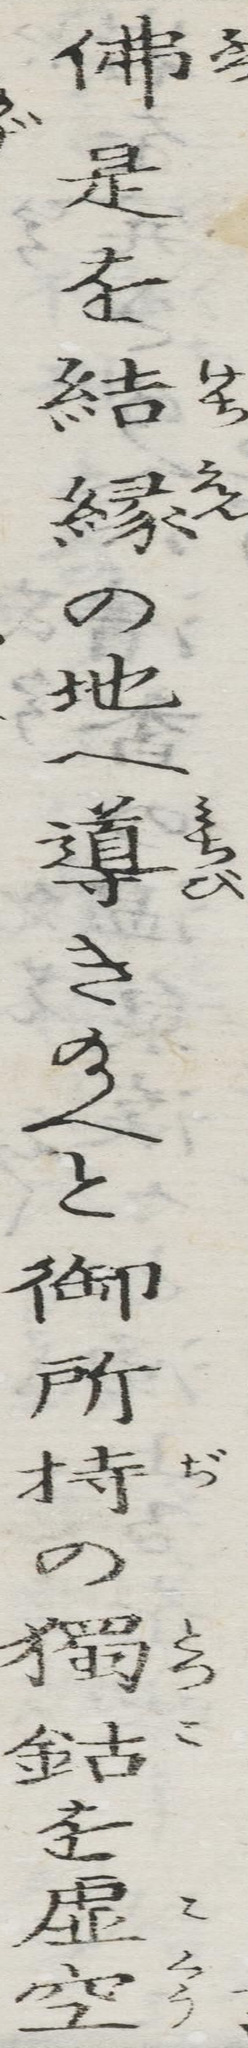佛是を結縁の地へ導き給へと御所持の獨鈷を虚空
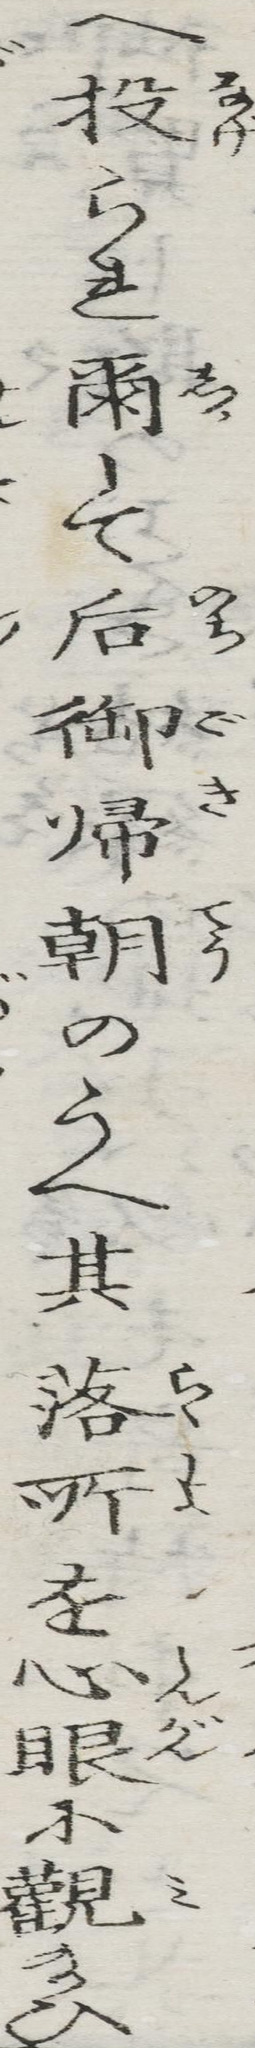へ投られ爾して后御帰朝のうへ其落所を心眼に観まひ
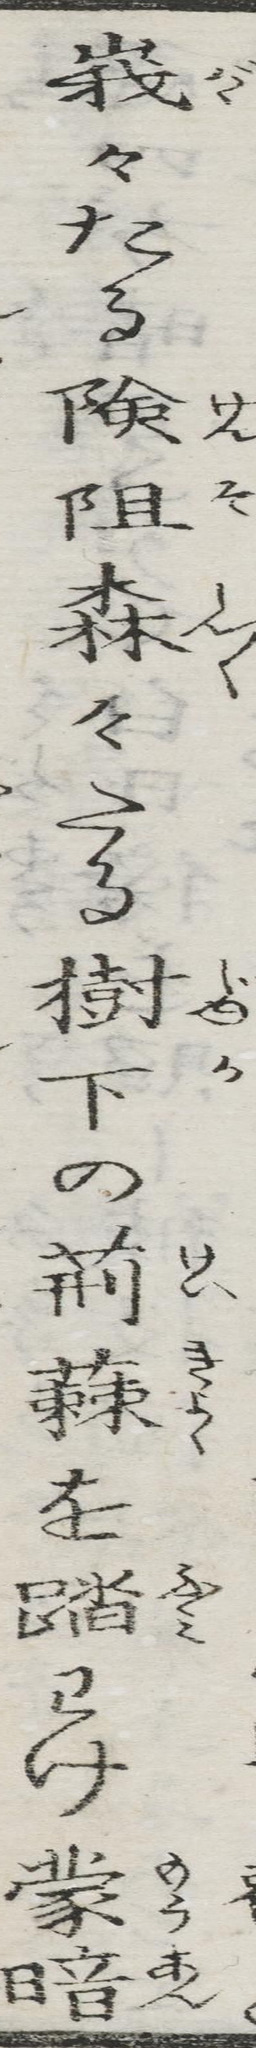峩々たる険阻森々たる樹下の荊棘を踏わけ蒙暗
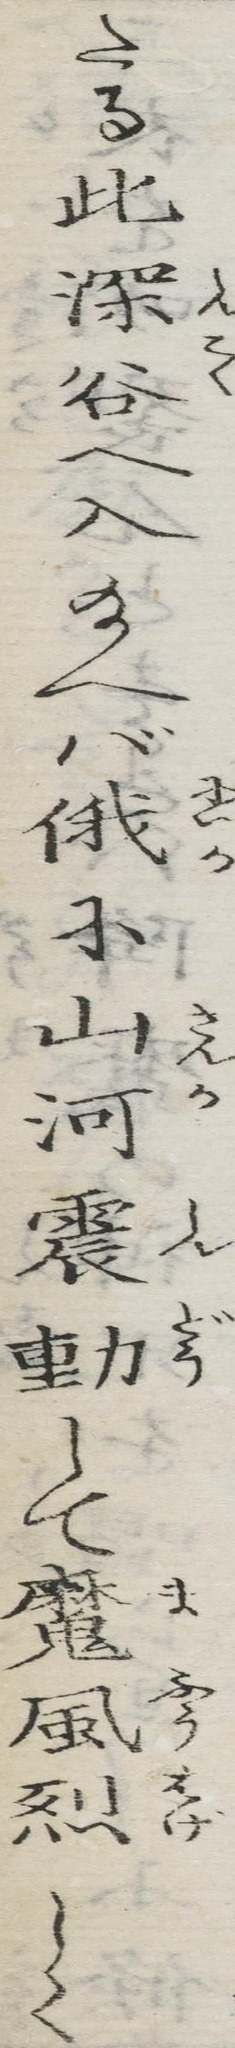たる此深谷へ入給へば俄に山河震動して魔風烈しく

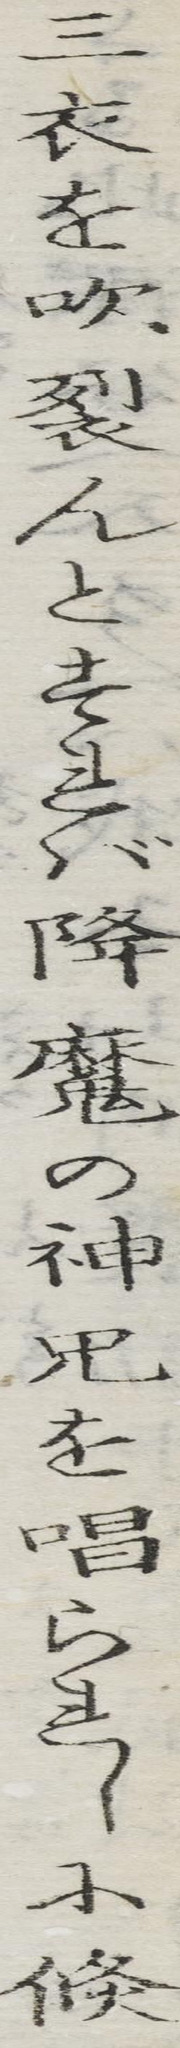三衣を吹裂んとすれば降魔の神咒を唱られしに条
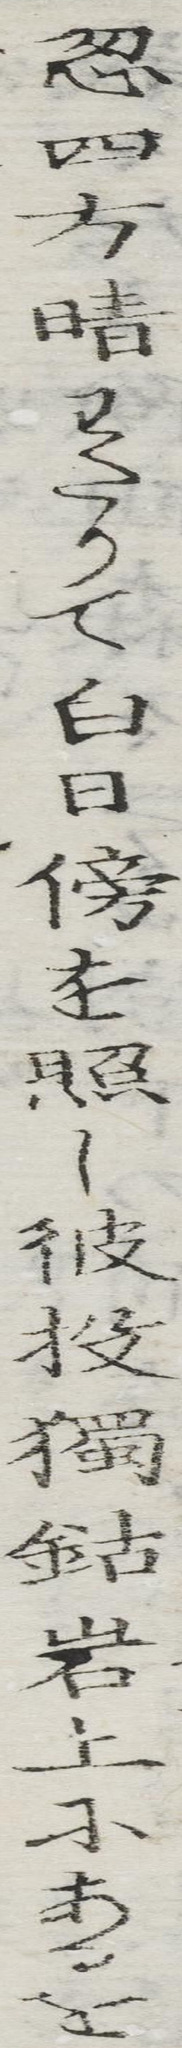忽四方晴わたりて白日傍を照し彼投独鈷岩上にあるを
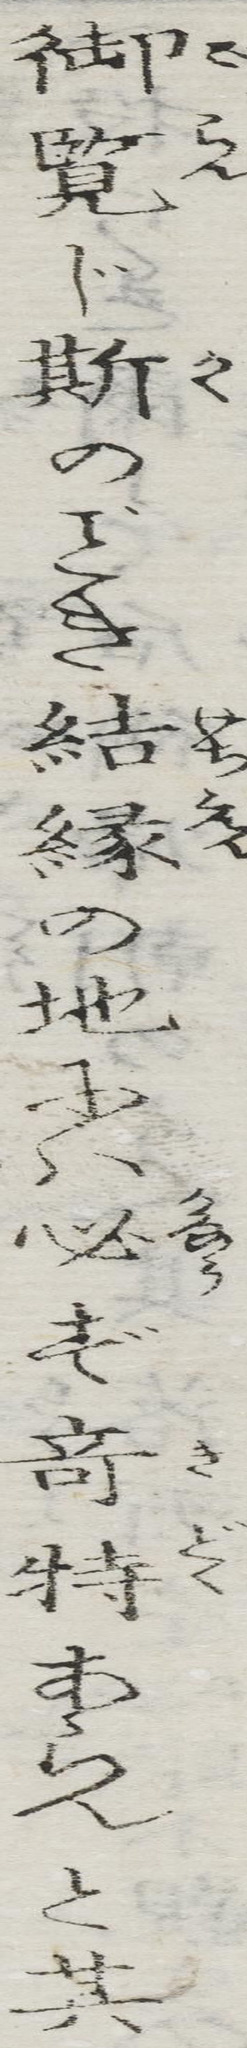御覧じ斯のごとき結縁の地にハ必ず奇特あらんと其
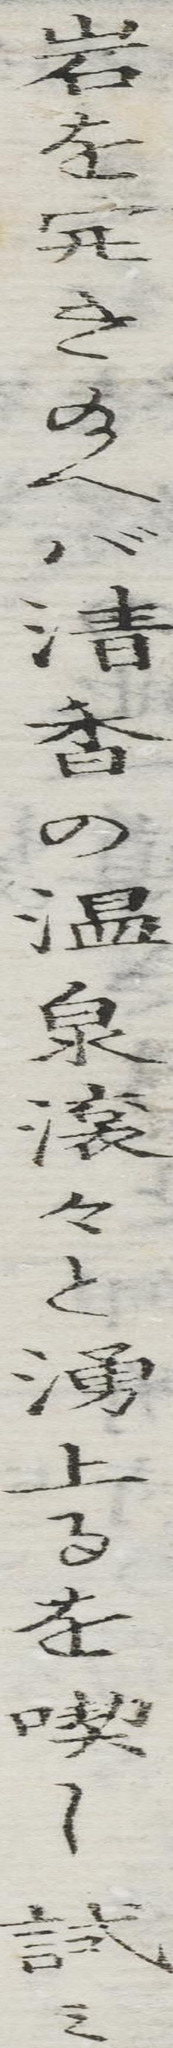岩を開き給へば清香の温泉滾々と湧上るを喫し試ミ
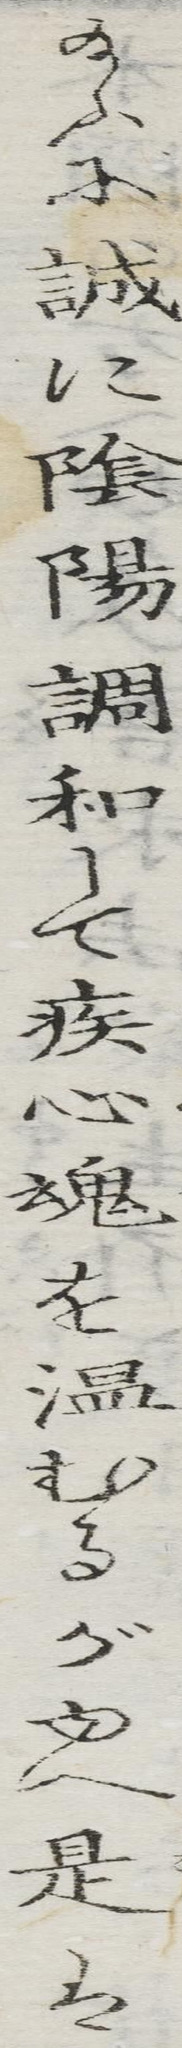給ふに誠に隂陽調和して疾心魂を温むるがゆへ是わ
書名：伊豆国修善寺温泉名所記　全
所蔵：東京大学地震研究所図書室 Earthquake Research Institute Library, The University of Tokyo, JAPAN
